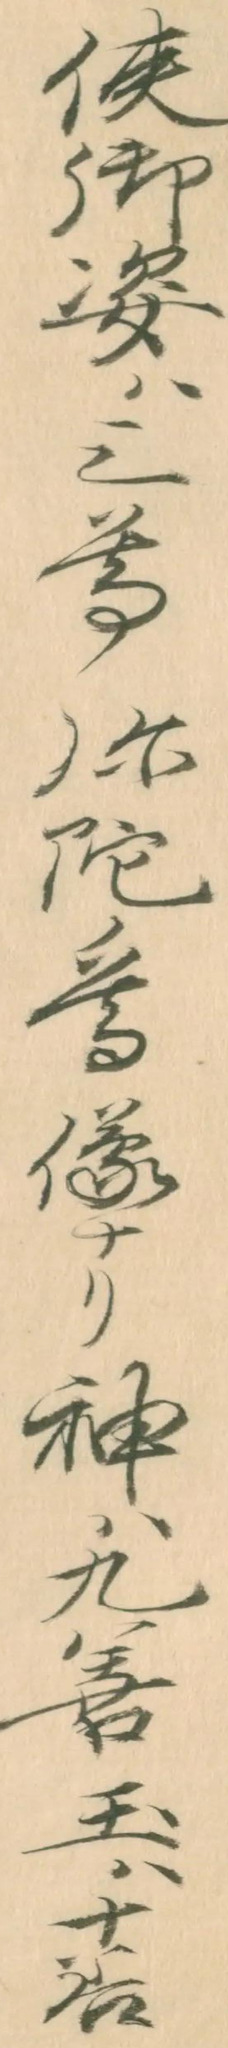使御姿ハ三尊弥陀尊像ナリ神ハ九善玉ハ十善
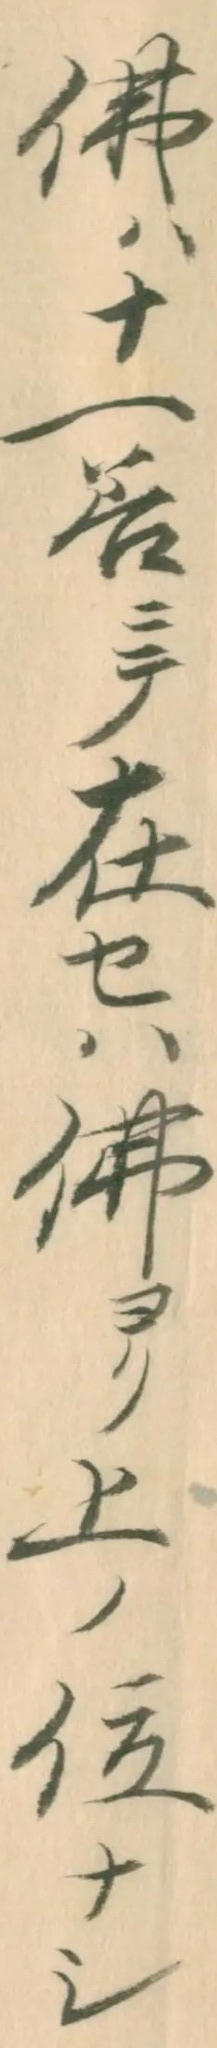仏ハ十一善ニテ在セハ仏ヨリ上ノ位ナシ
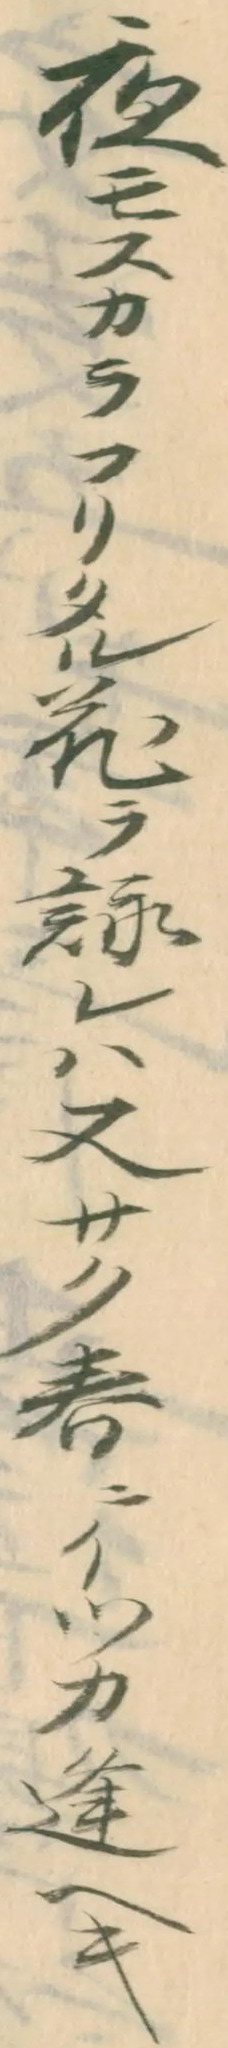夜モスカラフリタル花ヲ詠レハ又サク春ニイツカ逢ヘキ
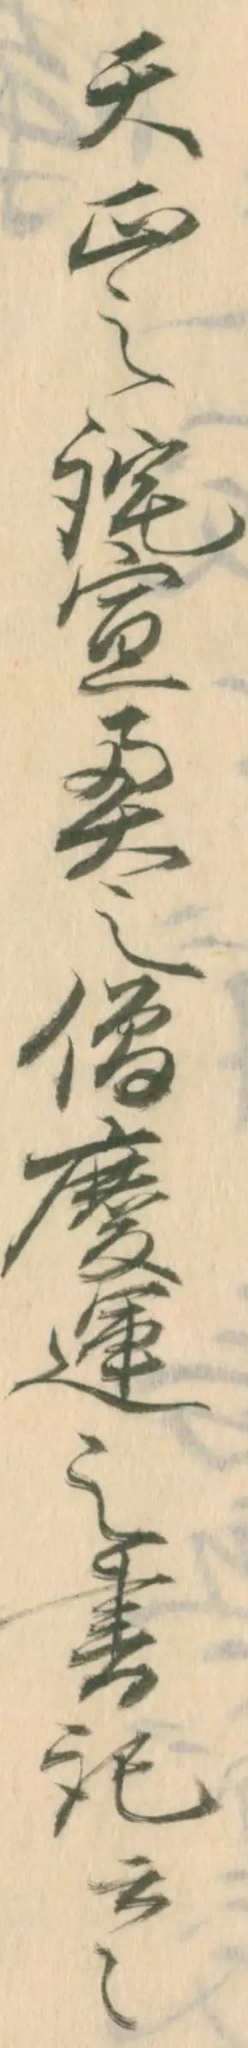天正之詫宣奥之僧慶運之書記云々
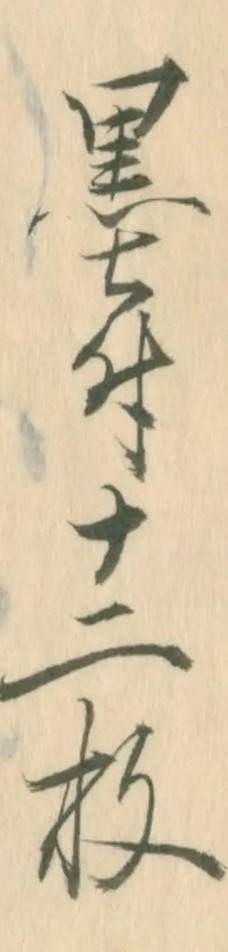墨付十二枚
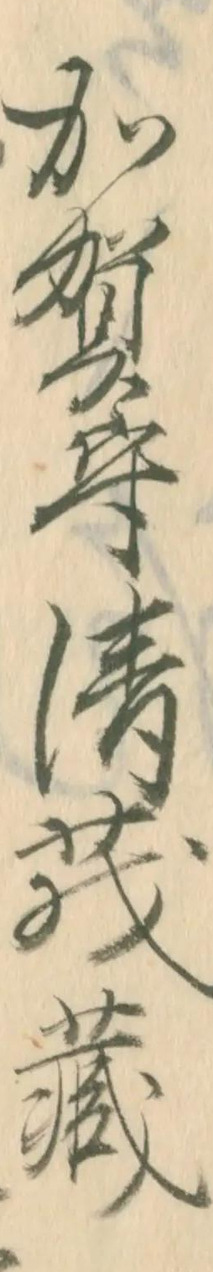加賀守清茂蔵
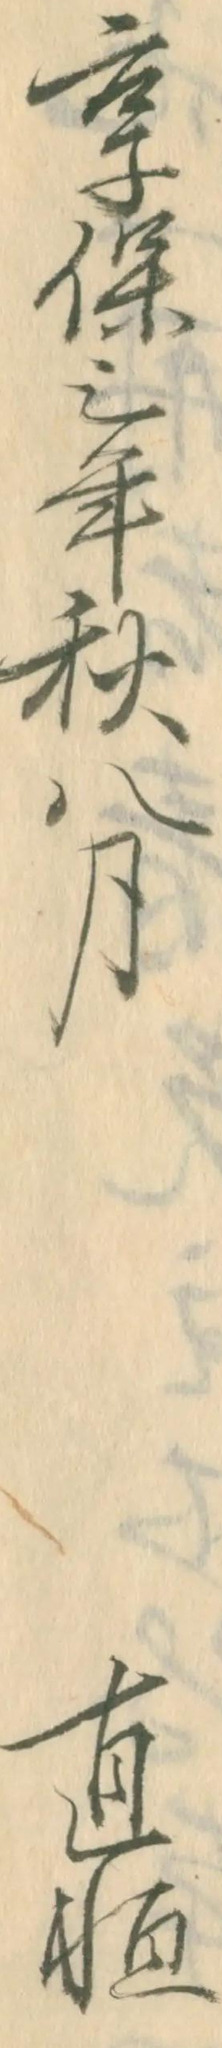享保三年秋八月直恒

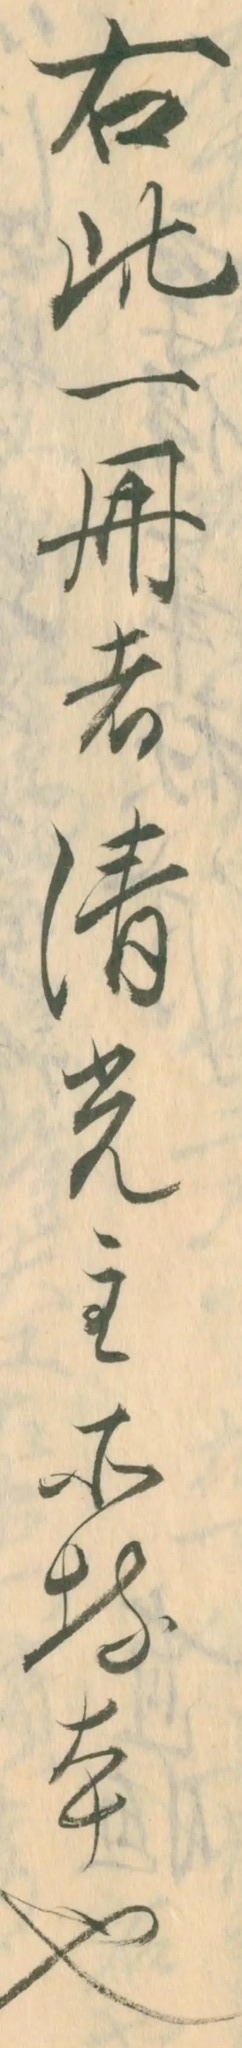右此一冊者清光主所持本也
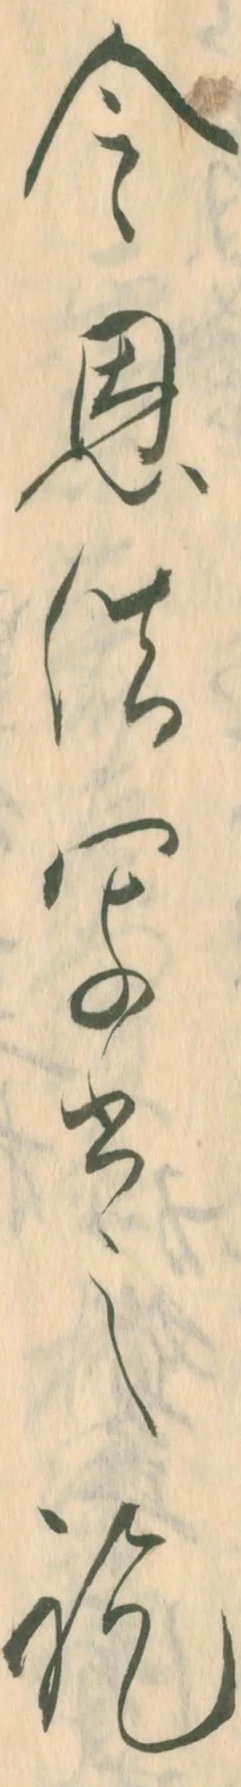令恩法写書之訖

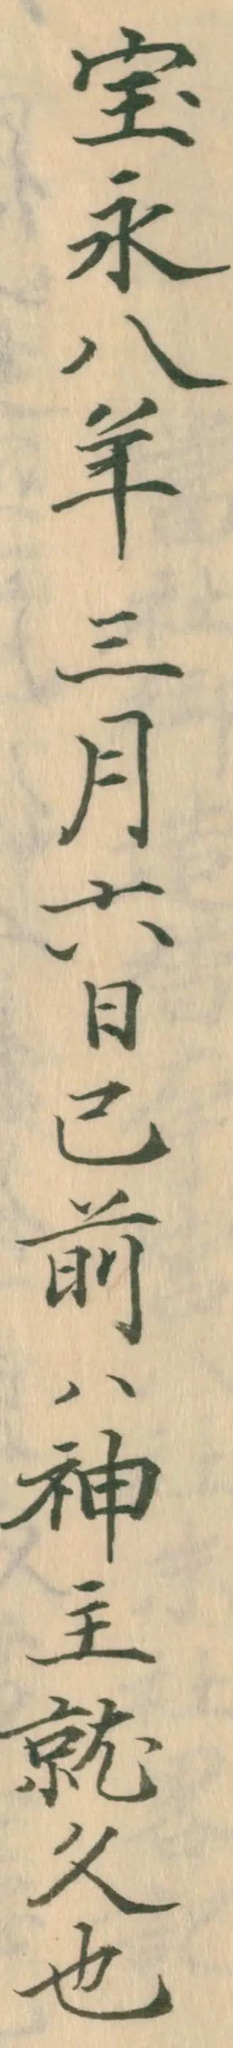宝永八年三月六日已前ハ神主就久也
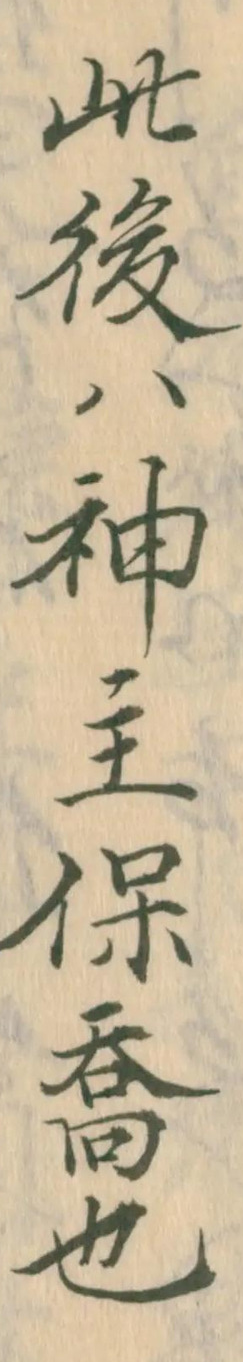此後ハ神主保喬也
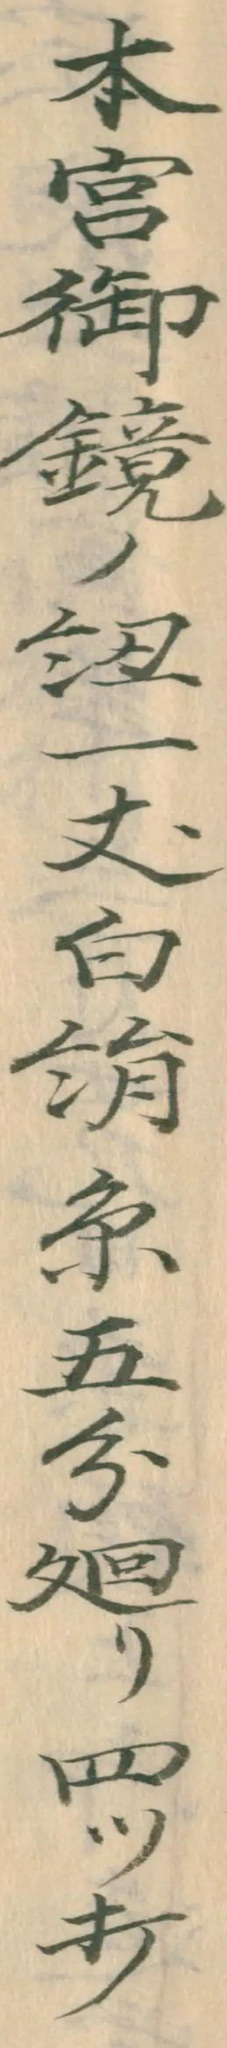本宮御鏡ノ紐一丈白絹糸五分廻リ四ツ打
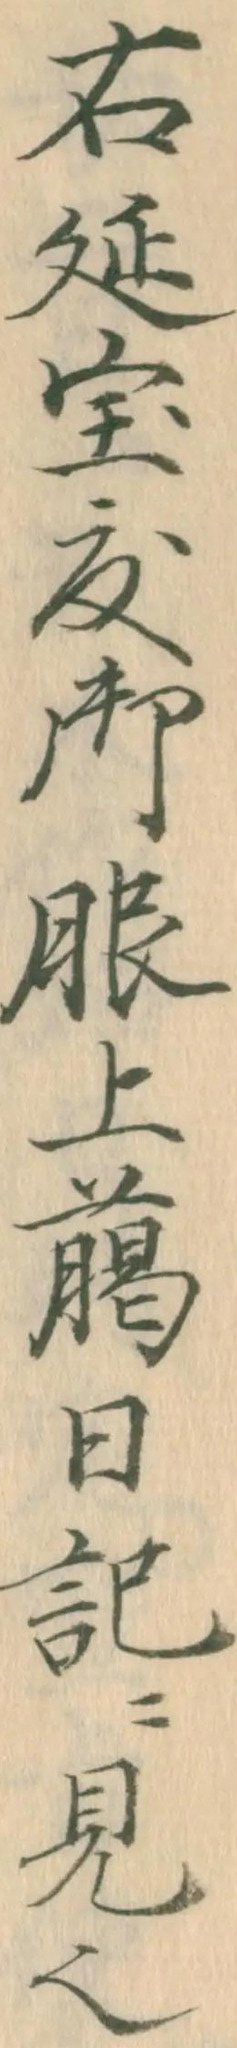右延宝度御服上臈日記ニ見也
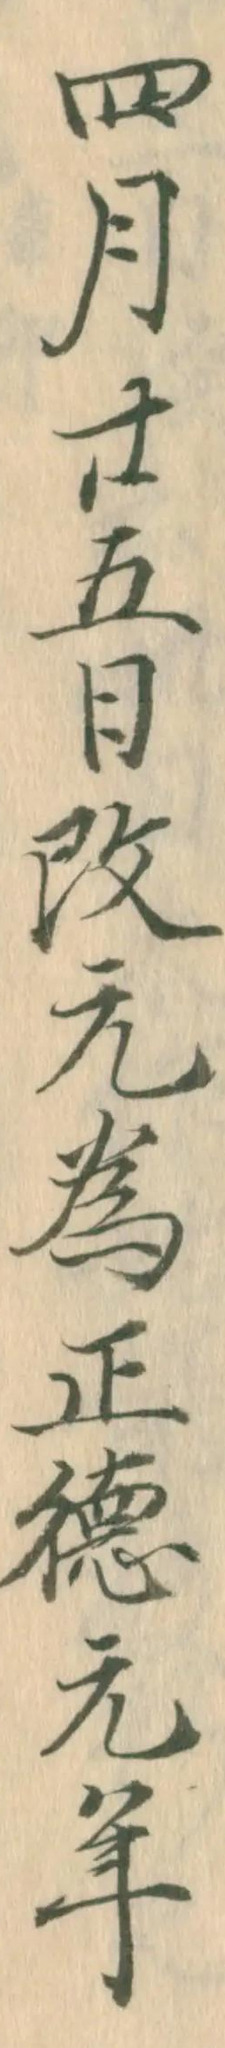四月廿五日改元為正徳元年
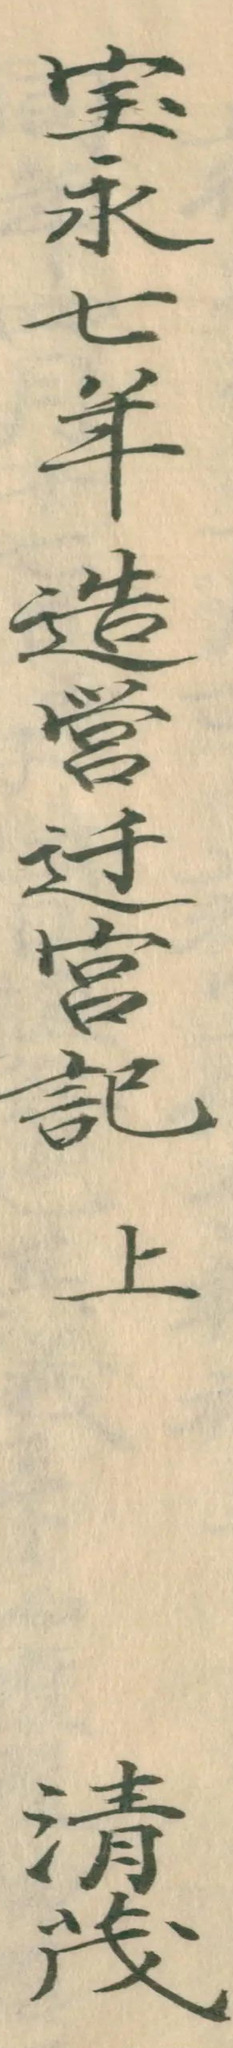宝永七年造営迁宮記上清茂
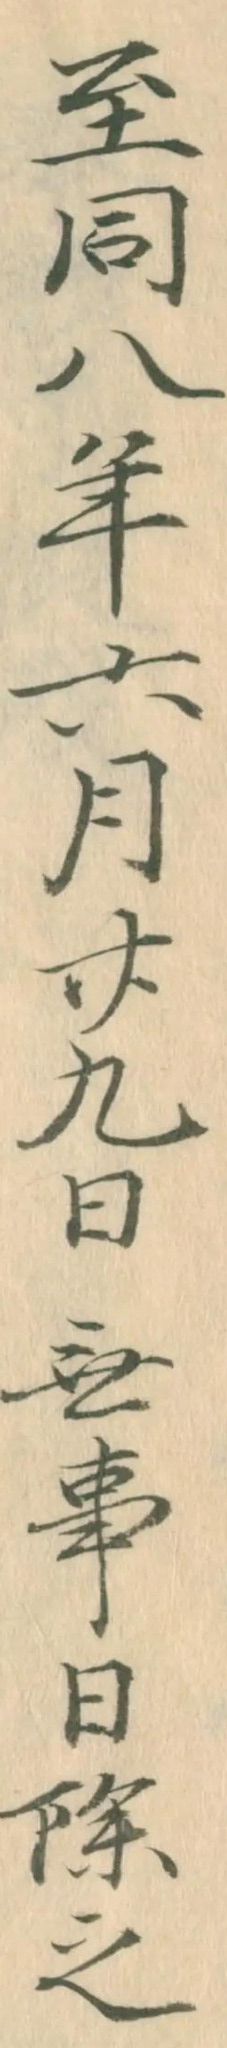至同八年六月廿九日無事日除之
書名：賀茂社記録. 第15冊
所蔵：国立国会図書館 National Diet Library, JAPAN
